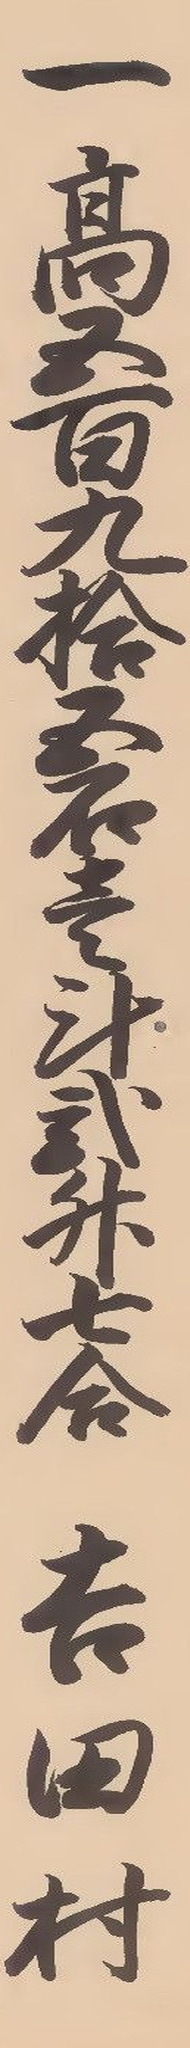一髙五百九拾五石壱斗弐升七合吉田村
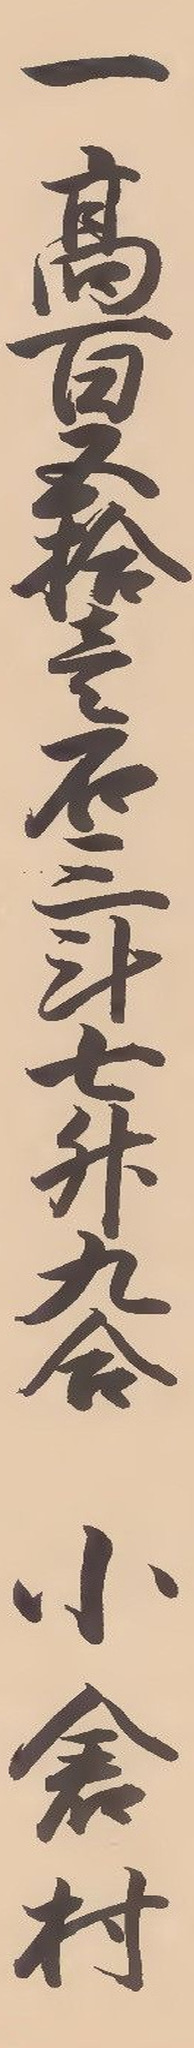一髙百五拾壱石三斗七升九合小倉村
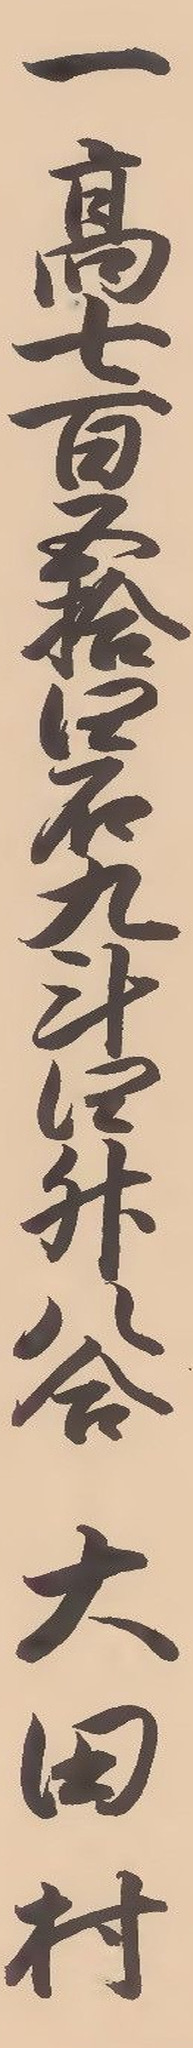一髙七百五拾四石九斗四升八合大田村
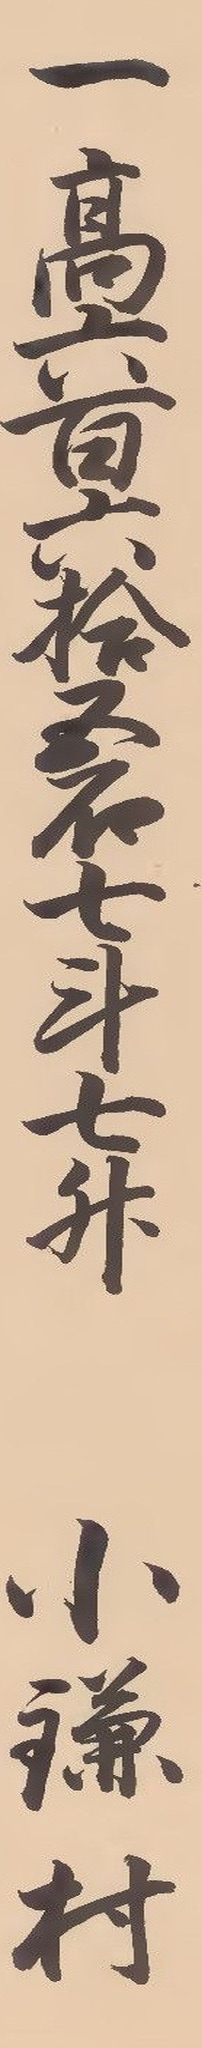一髙六百六拾五石七斗七升小鎌村
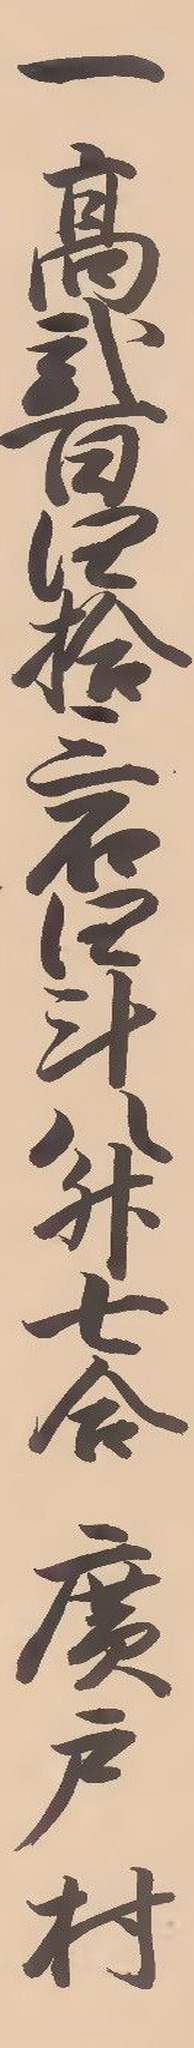一髙弐百四拾三石四斗八升七合廣戸村
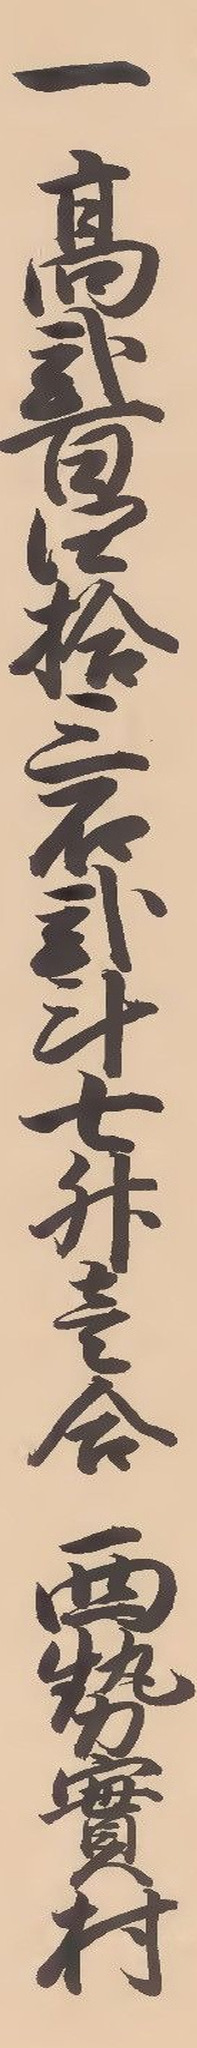一髙弐百四拾三石弐斗七升壱合西勢實村
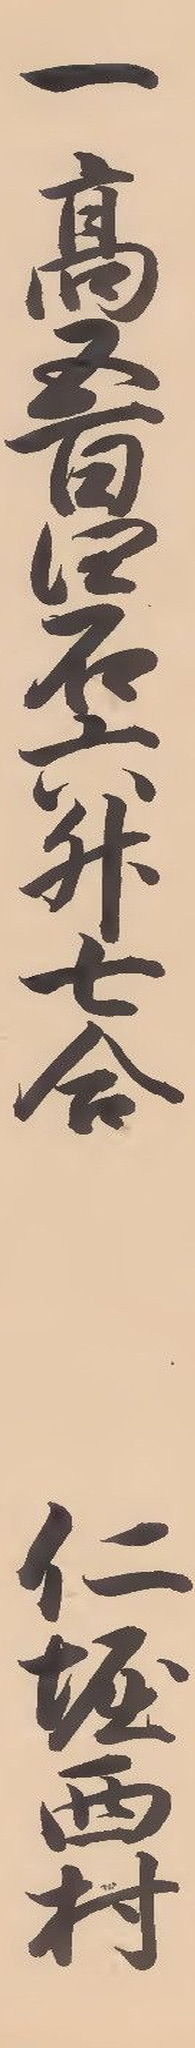一髙五百四石六升七合仁堀西村
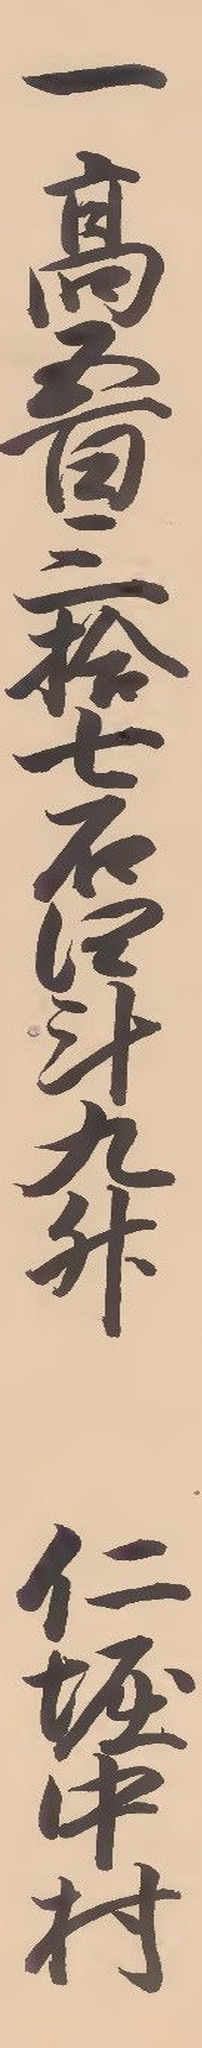一髙五百三拾七石四斗九升仁堀中村

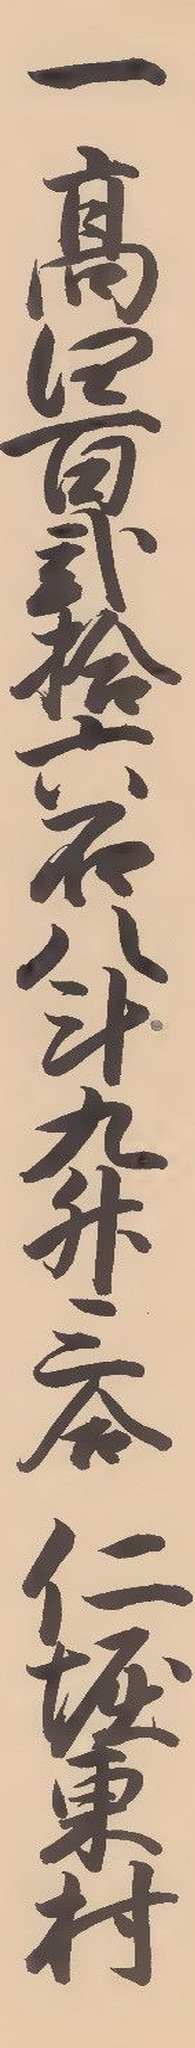一髙四百弐拾六石八斗九升三合仁堀東村
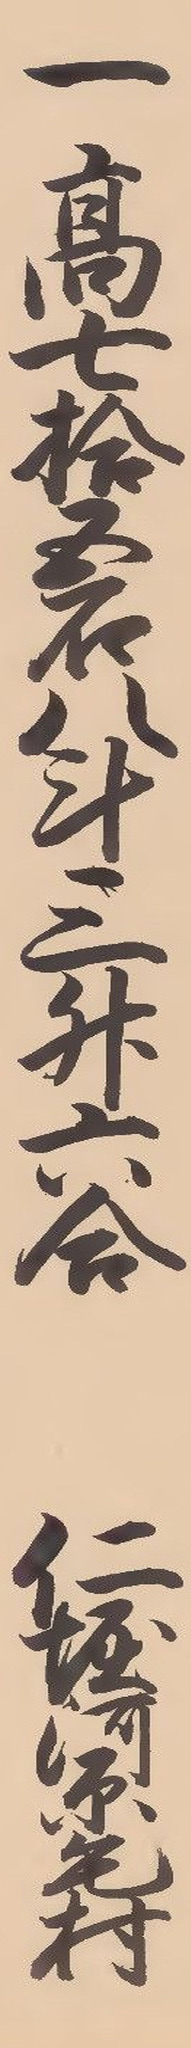一髙七拾五石八斗三升六合仁堀河原毛村
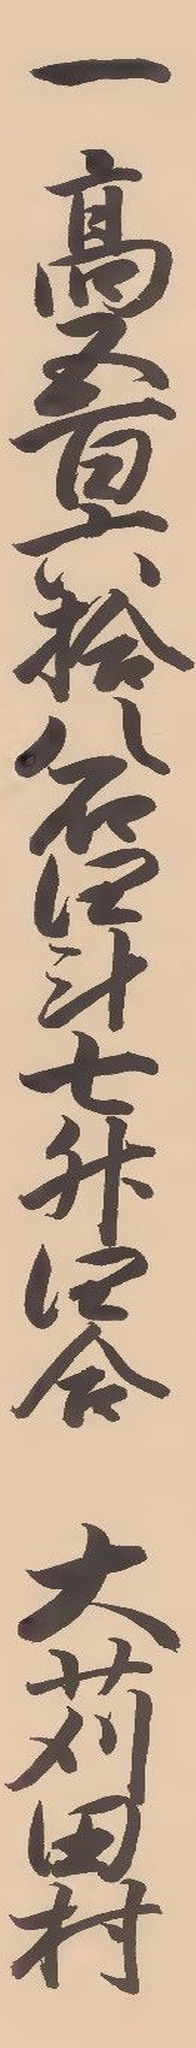一髙五百六拾八石四斗七升四合大苅田村
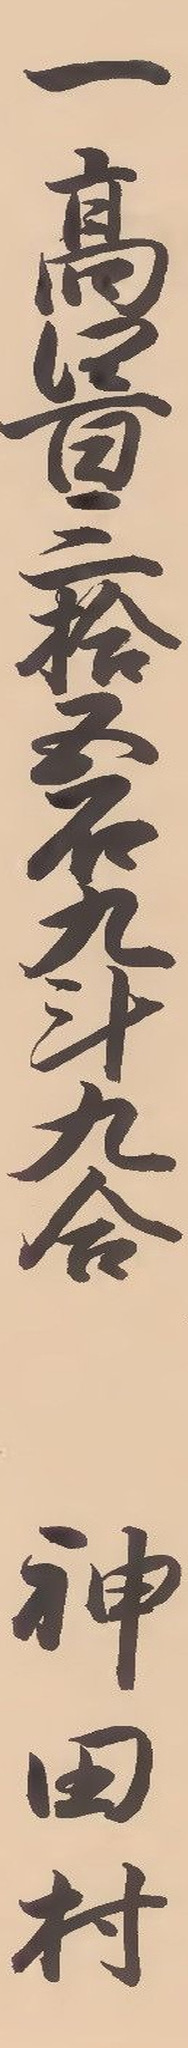一髙四百三拾五石九斗九合神田村
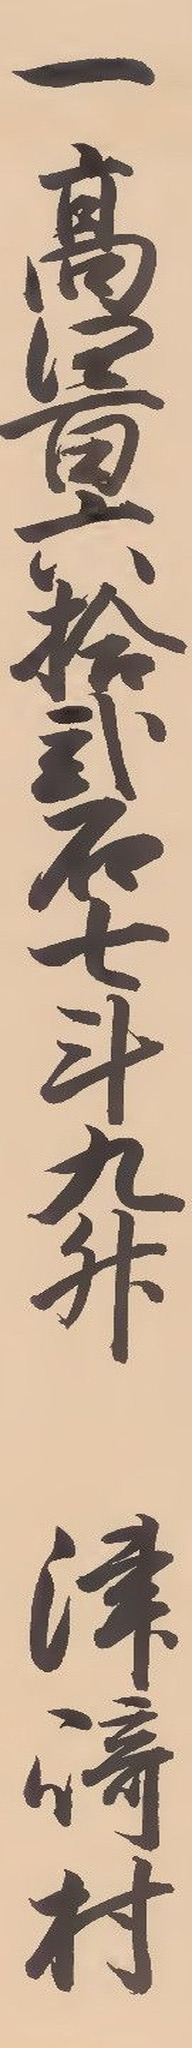一髙四百六拾弐石七斗九升津崎村
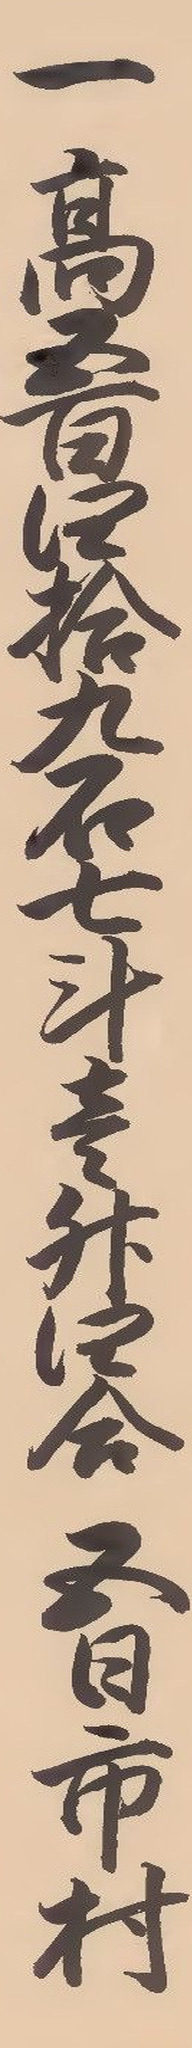一髙五百四拾九石七斗壱升四合五日市村
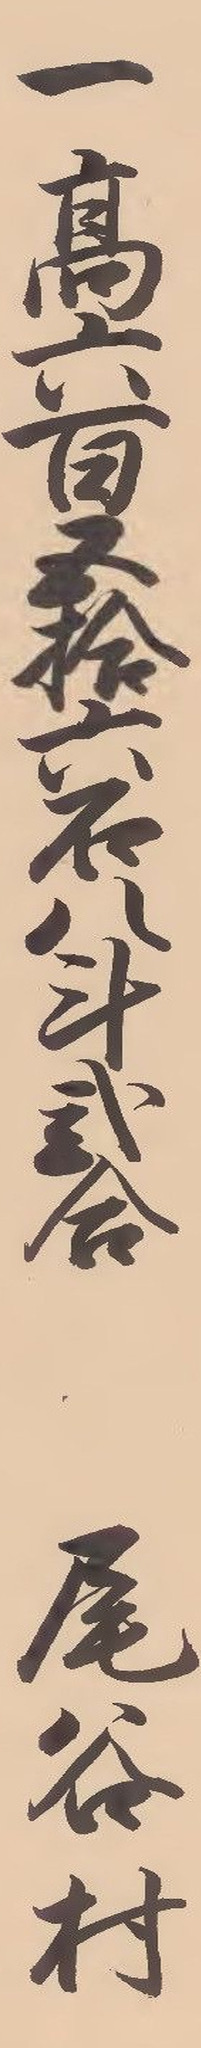一髙六百五拾六石八斗弐合尾谷村
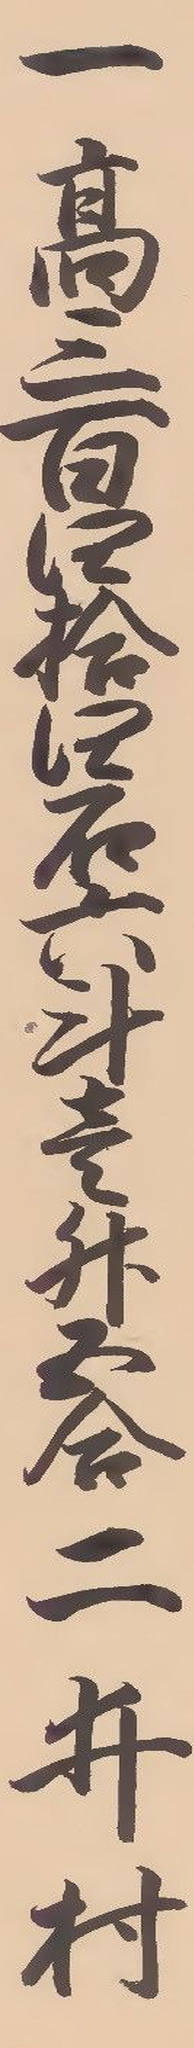一髙三百四拾四石六斗壱升五合二井村
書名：備前国郷帳
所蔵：国立公文書館 National Archives of Japan
